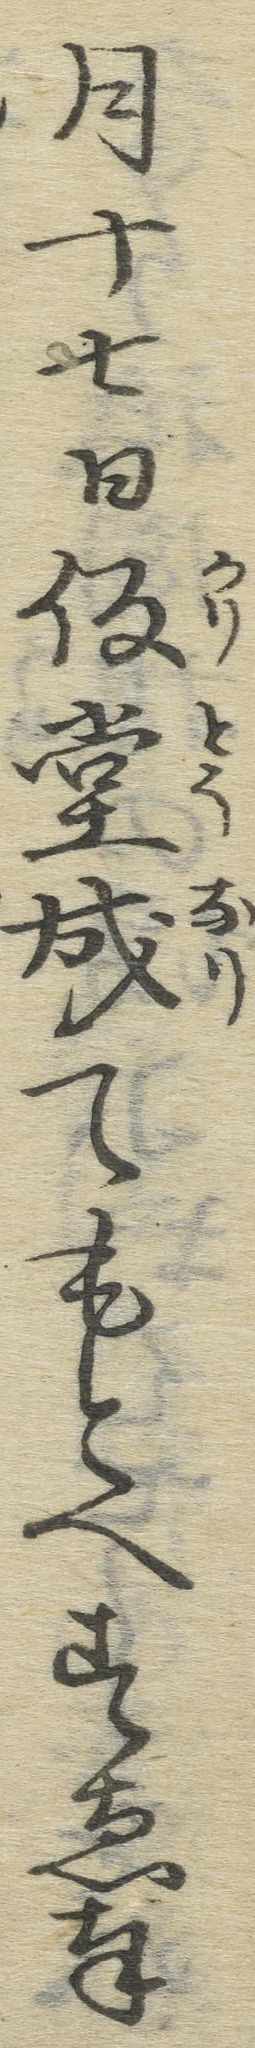月十七日仮堂成てもとへすゑ奉
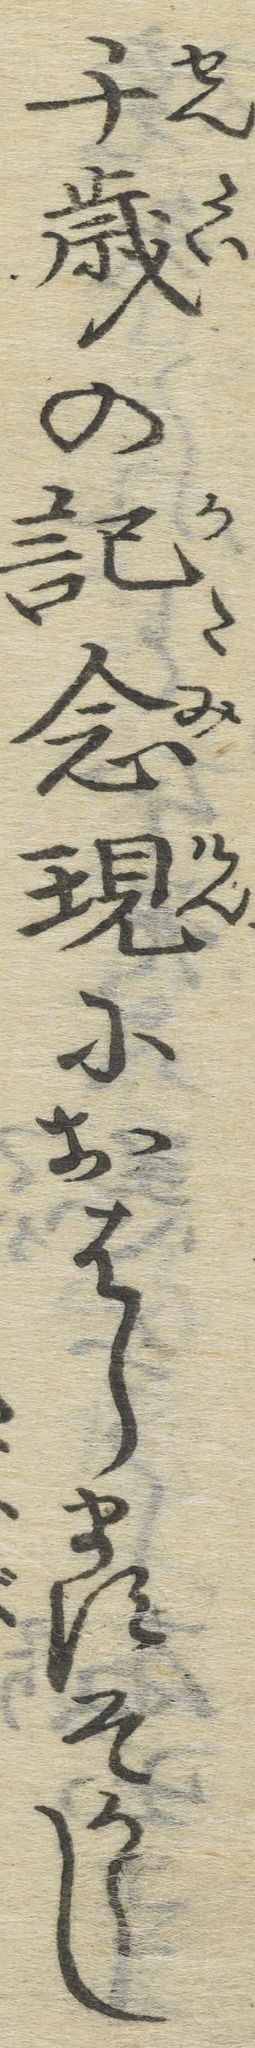千歳の記念現におはしますそかし
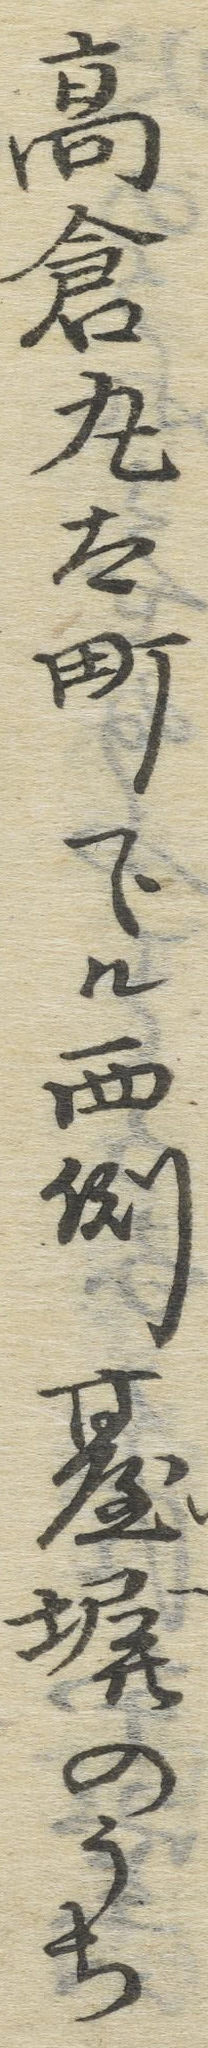高倉丸太町では西側台塀のうち
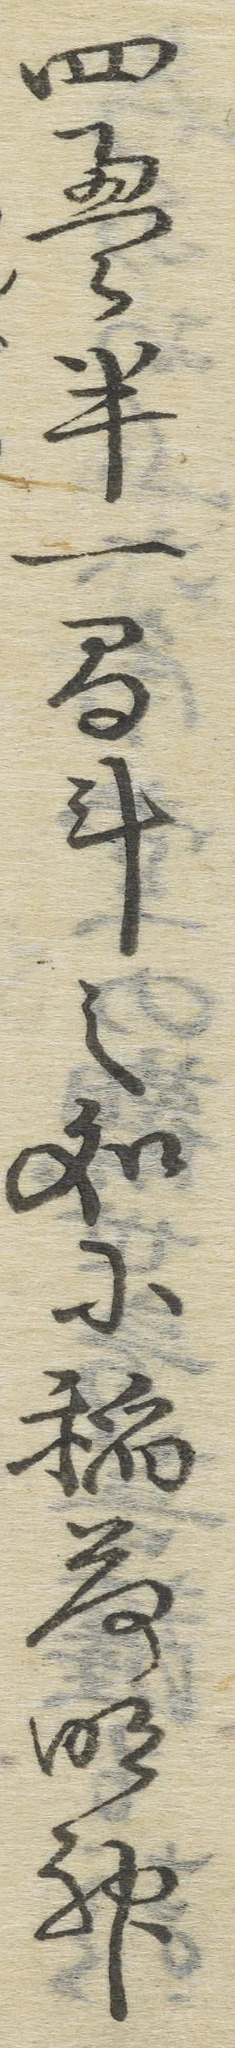四畳半一間斗の処に稲荷明神
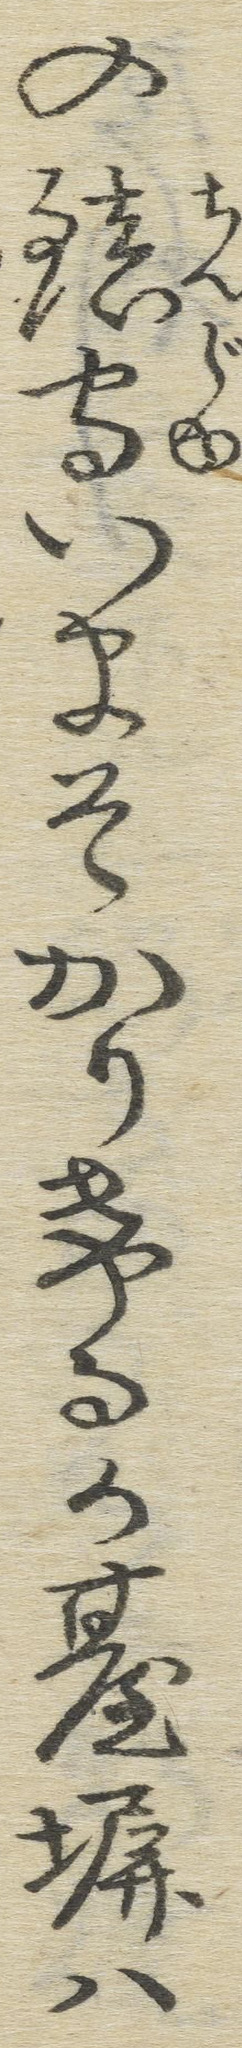の鎮守いまそかりけるか台塀は
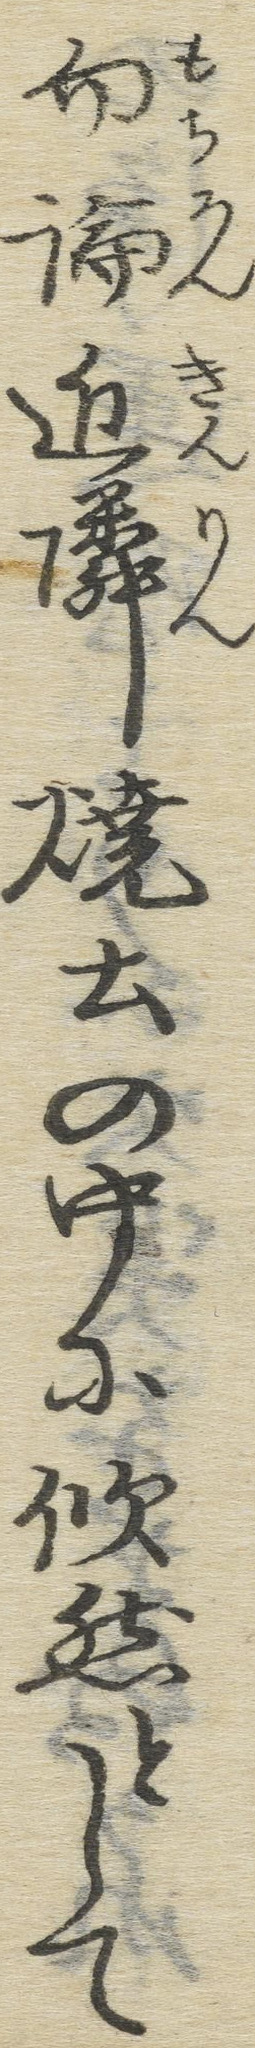勿論近隣焼土の中に悠然として
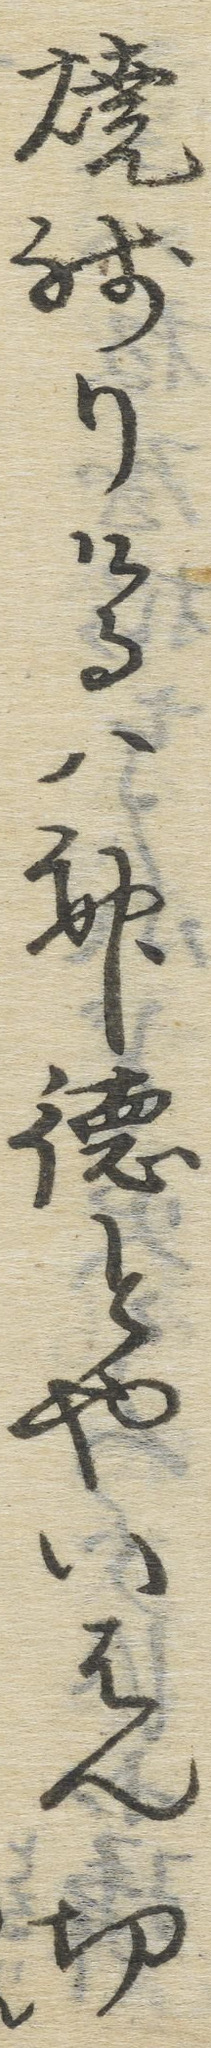焼残りけるは神徳とやいはん切
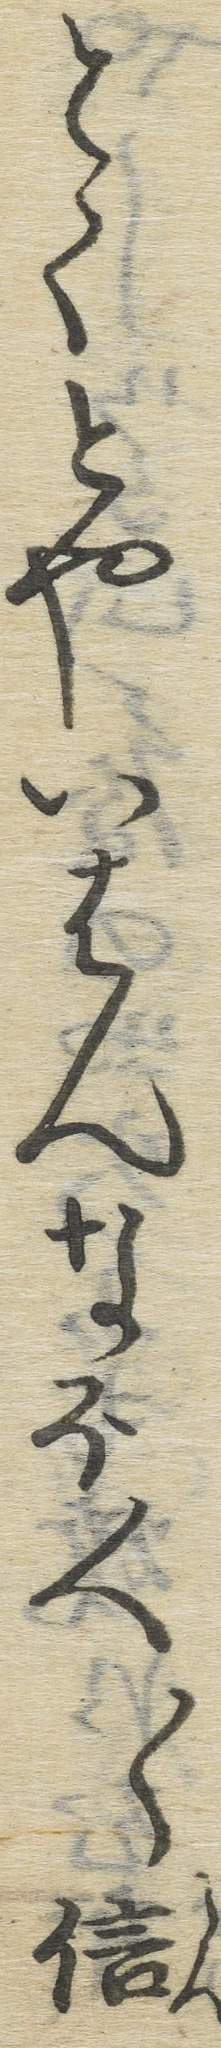とくとやいはんなほ人〳〵信
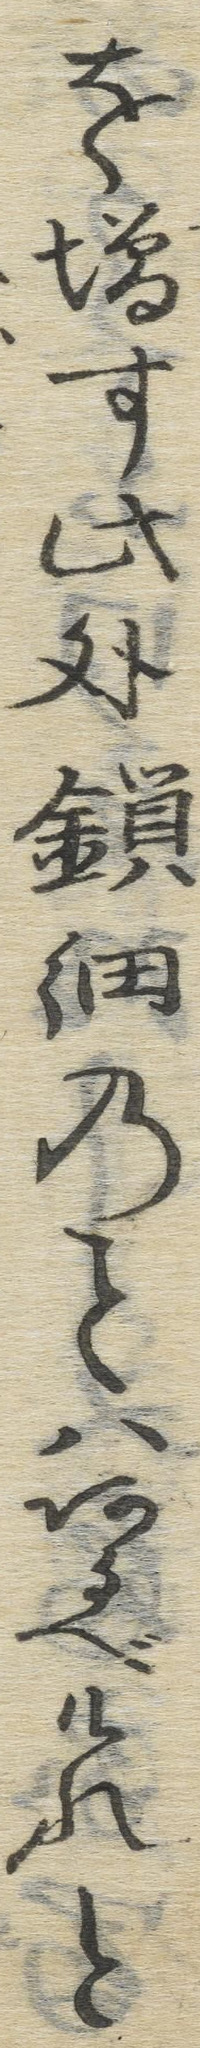を増す此外鎖細のことはあるべけれと
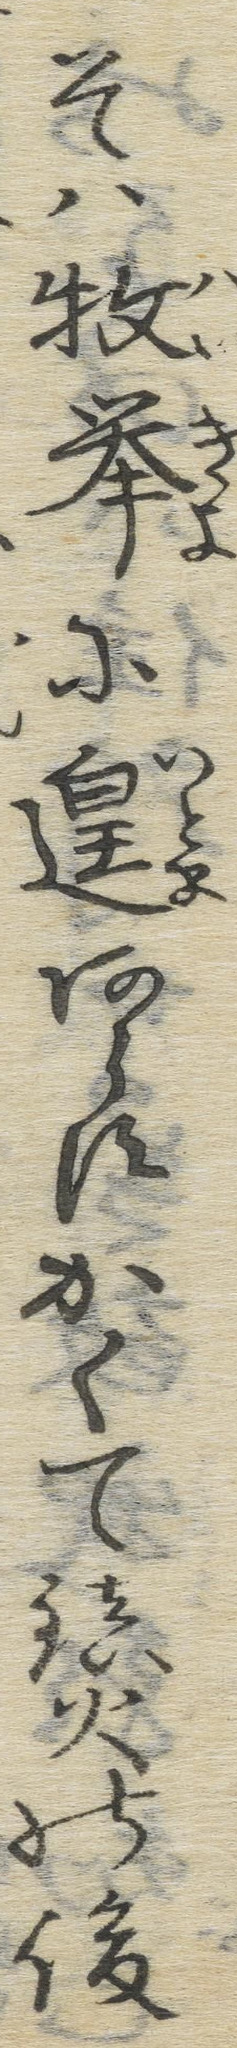そは牧挙に遑あらすかくて鎮火の後
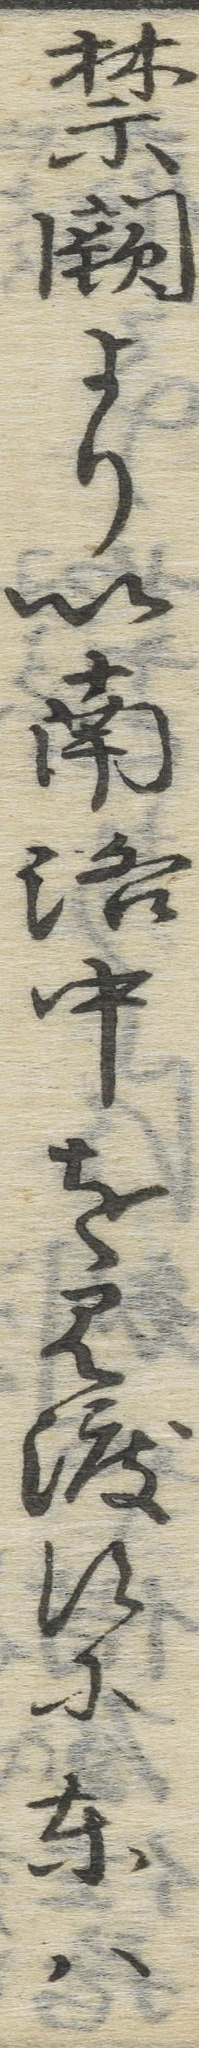禁闕より以南洛中を見渡すに東は
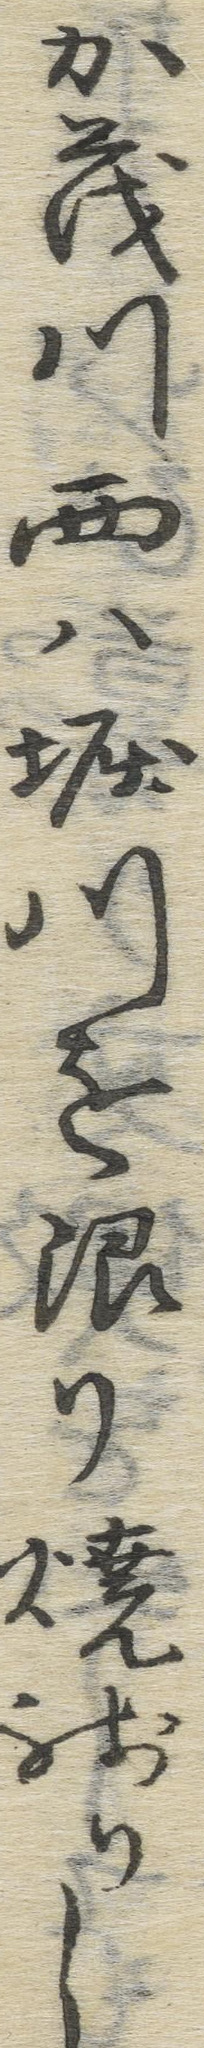か茂川西は堀川を限り焼残りし
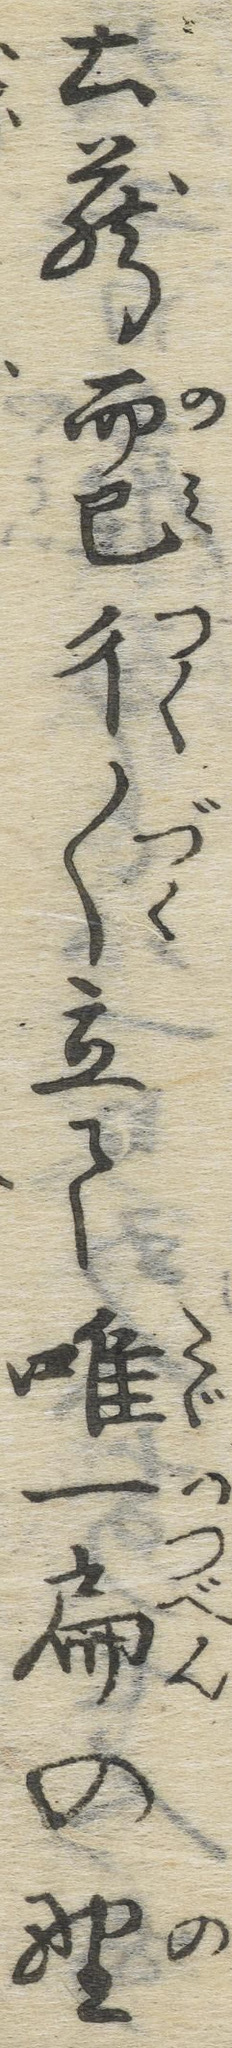土蔵而巳彳〳〵立て唯一扁の野
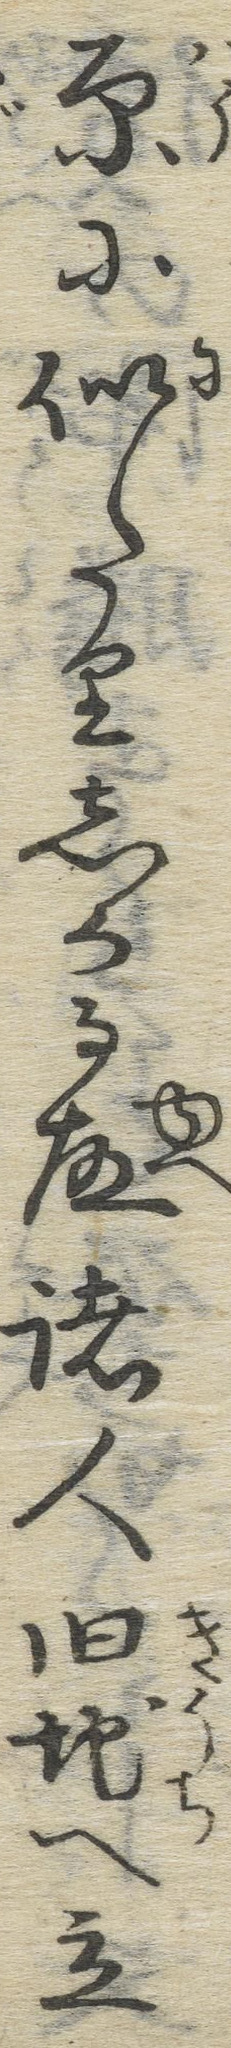原に似たりしかる故諸人旧地へ立
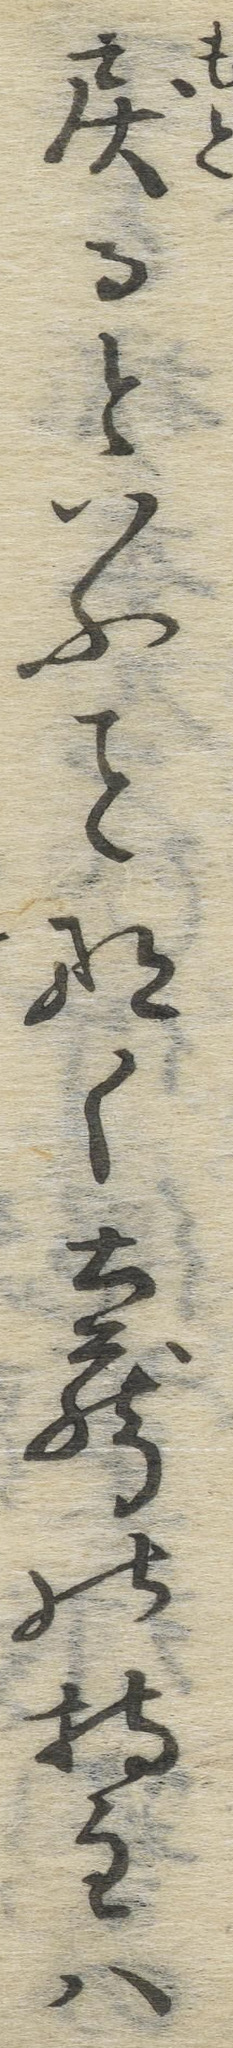戻るといふことなく土蔵の持主は
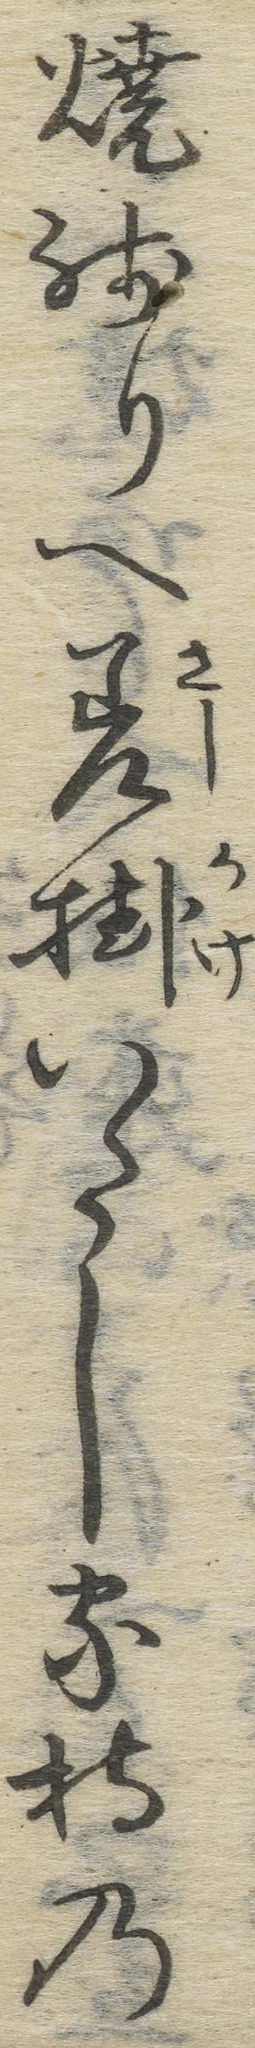焼残りへ差掛いたし家持の
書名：あきの日照
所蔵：東京大学地震研究所図書室 Earthquake Research Institute Library, The University of Tokyo, JAPAN
